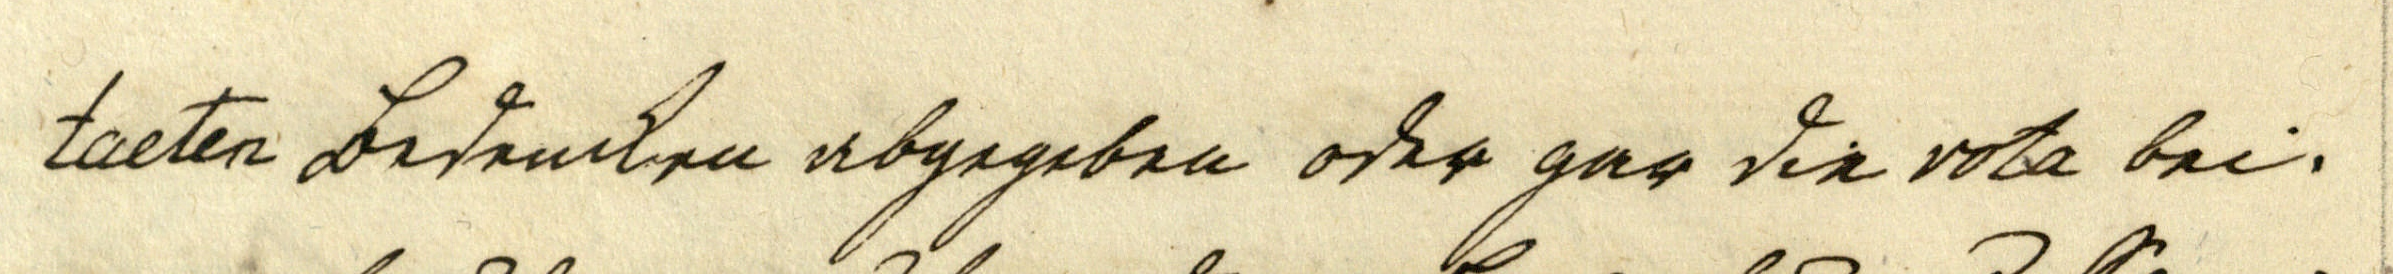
taeten Bedenken abgegeben oder gar die vota bei-
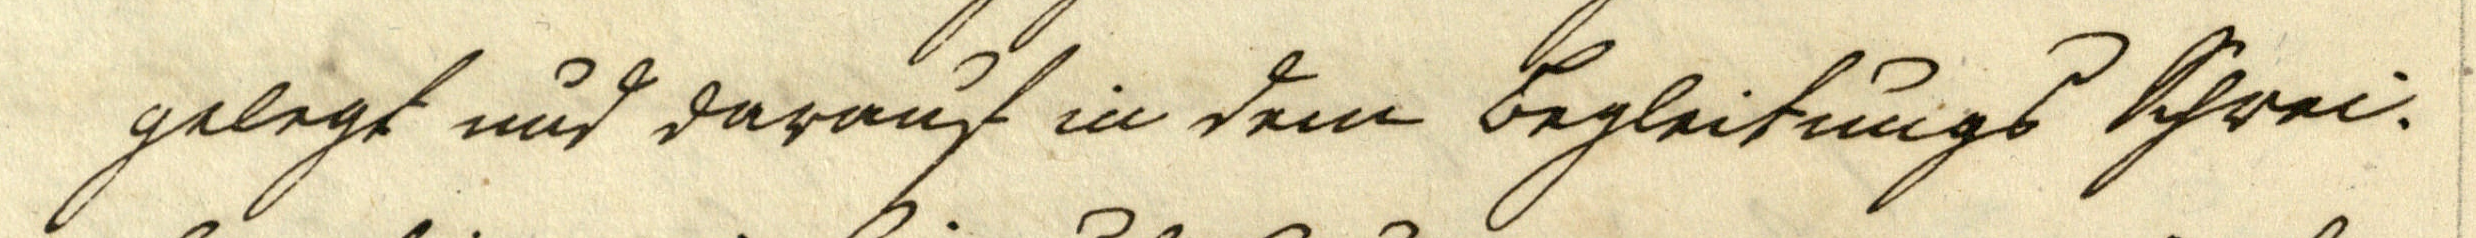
gelegt und darauf in dem Begleitungs Schrei-
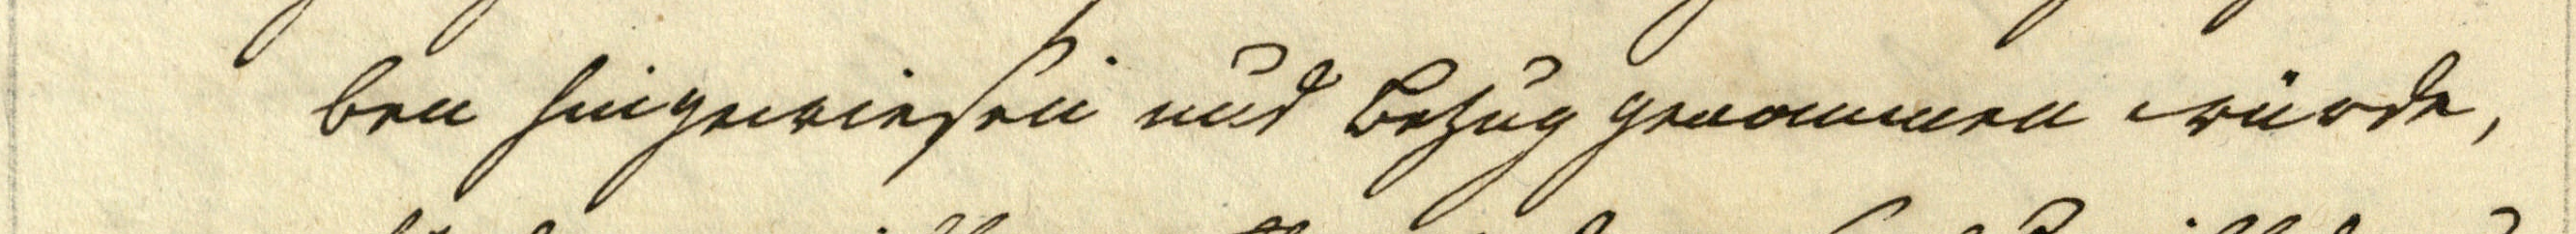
ben hingewiesen und Bezug genommen würde,
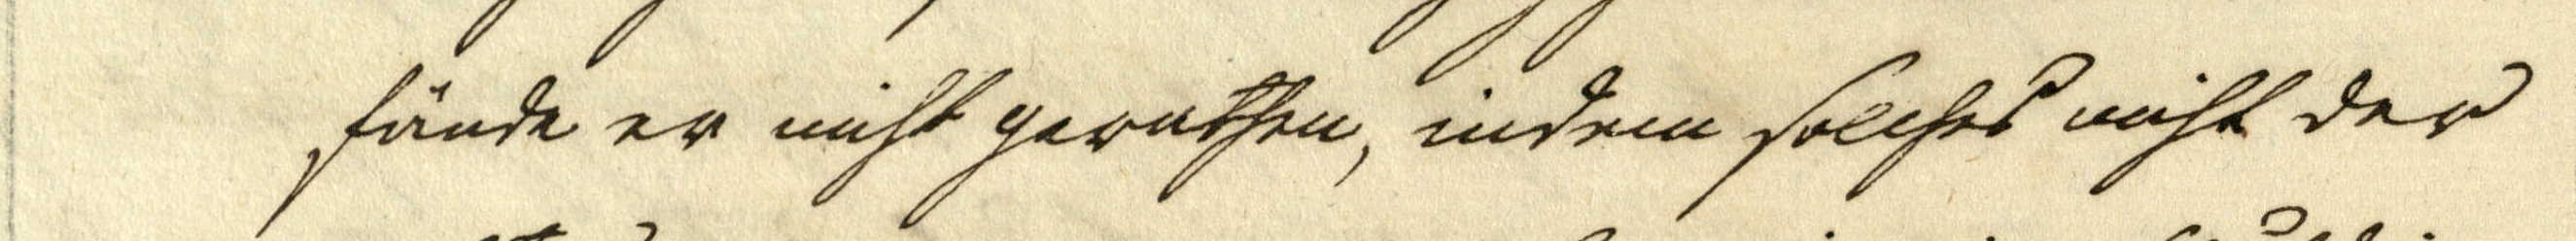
fände er nicht gerathen, indem solches nicht der
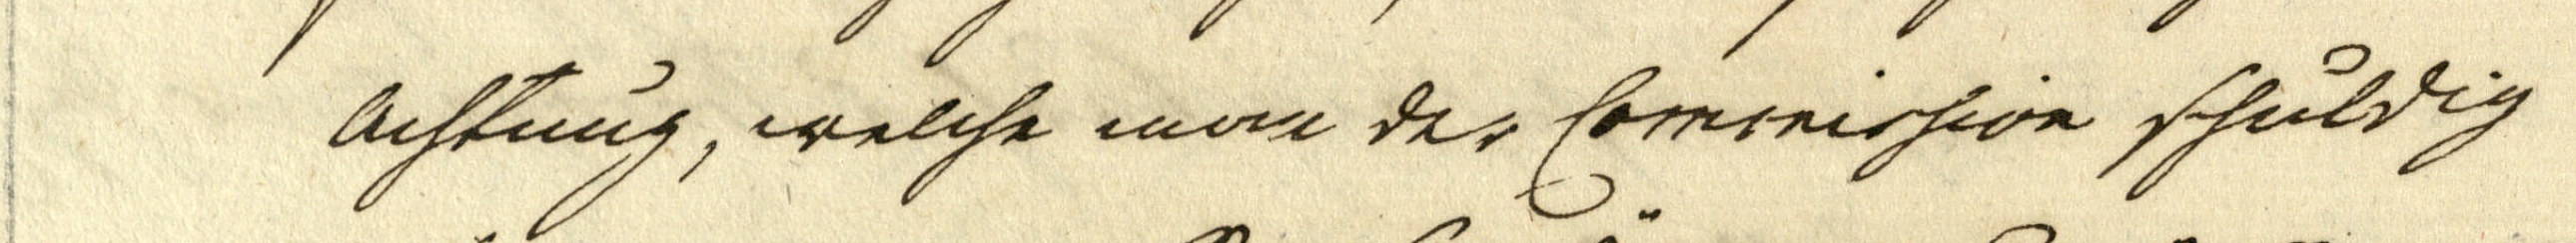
Achtung, welche man der Commission schuldig
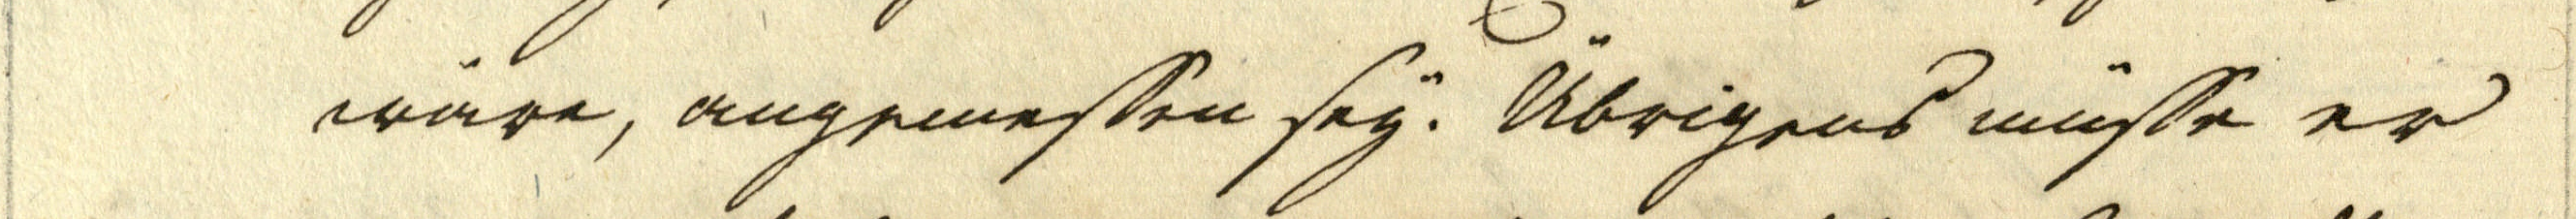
wäre, angemessen sey. Übrigens müsse er
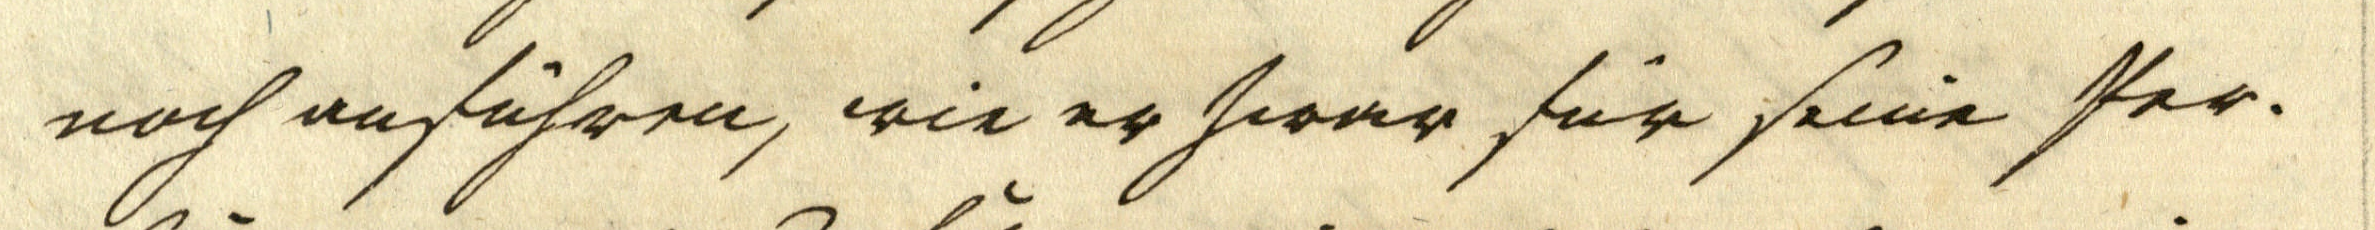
noch anführen, wie er zwar für seine Per-
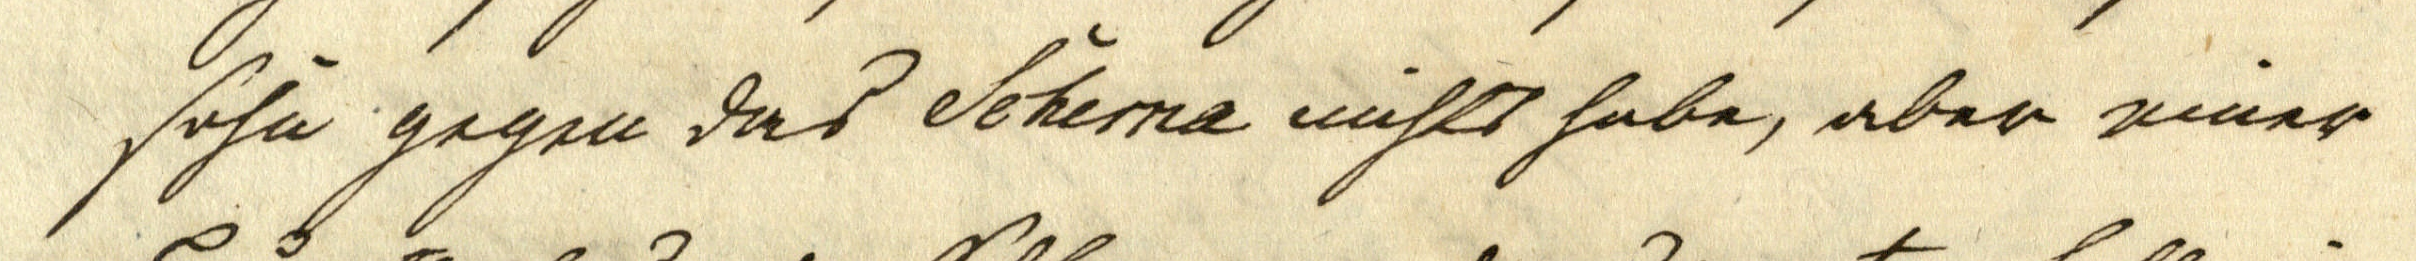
sohn gegen das Schema nichts habe, aber einer
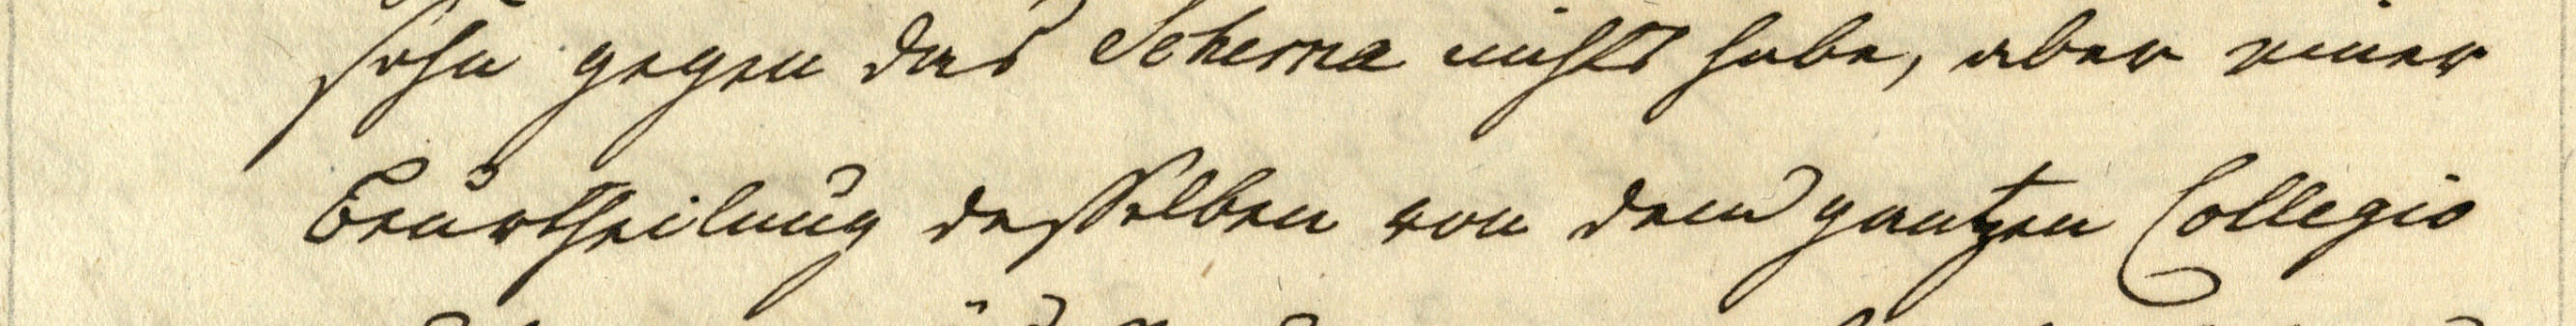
Beurtheilung desselben von dem gantzen Collegio
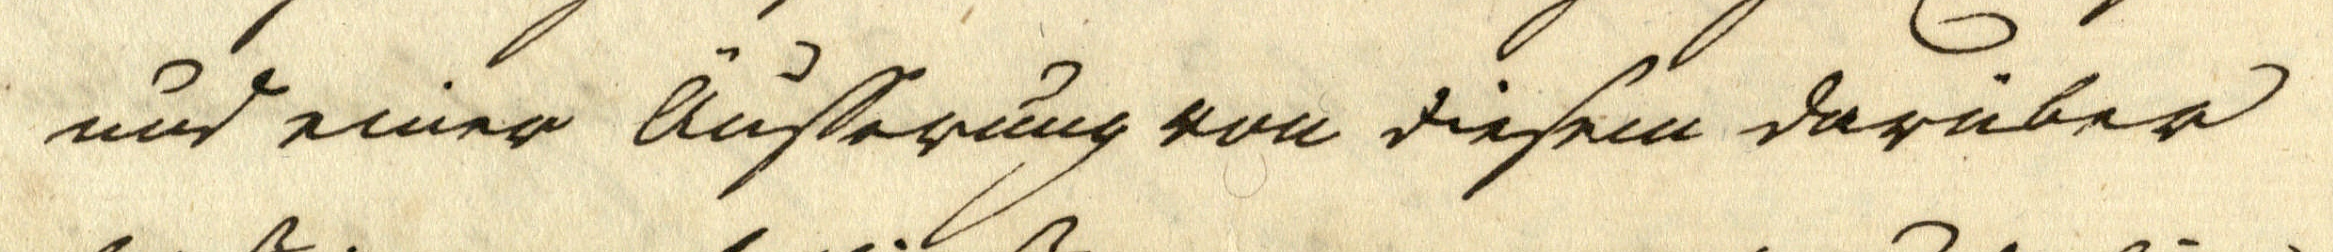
und einer Äusserung von diesem darüber
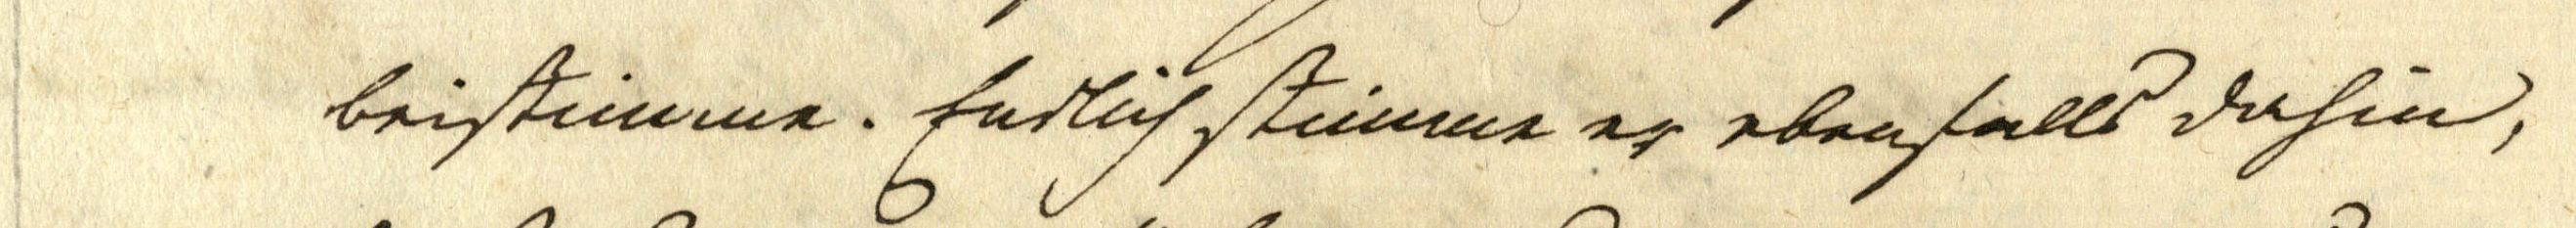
beistimme. Endlich stimme er ebenfalls dahin,
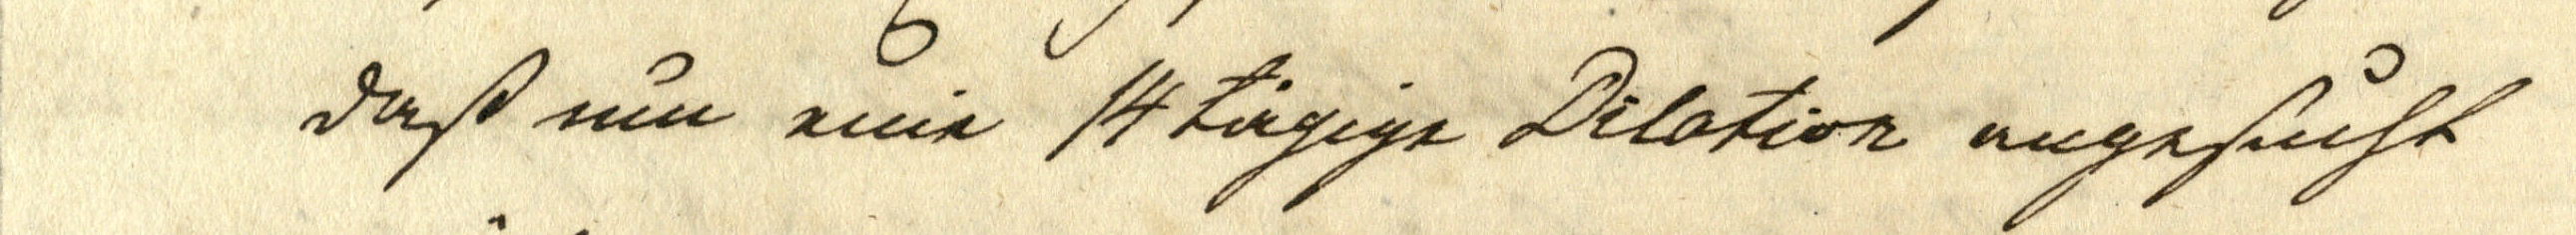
daß nun eine 14tägige Dilation angesucht
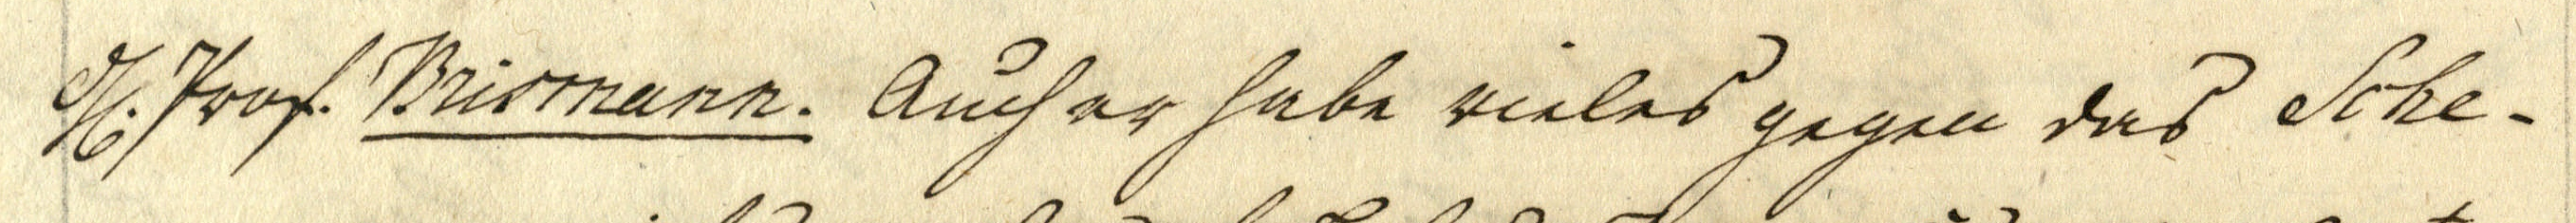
dh. Prof. Brismann. Auch er habe vieles gegen das Sche-
